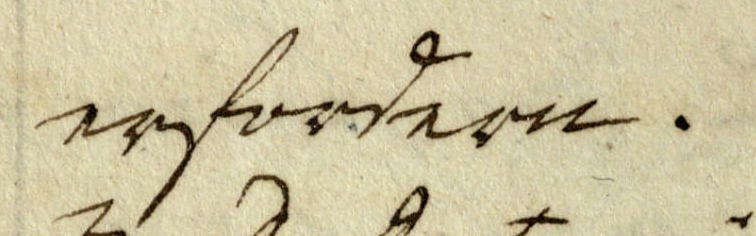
erfordern.
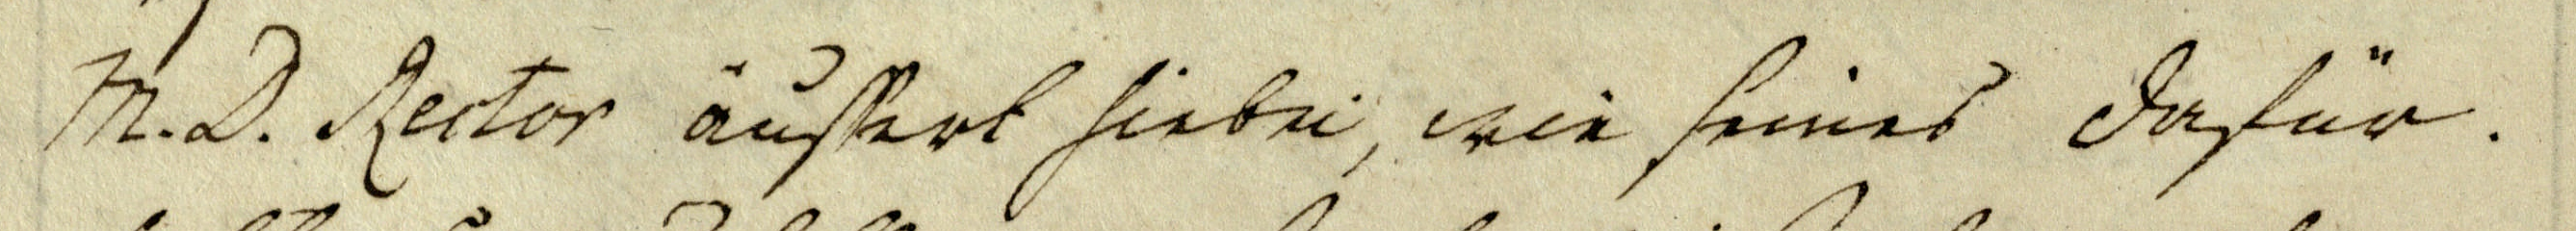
M. D. Rector äussert hiebei, wie seines Dafür¬
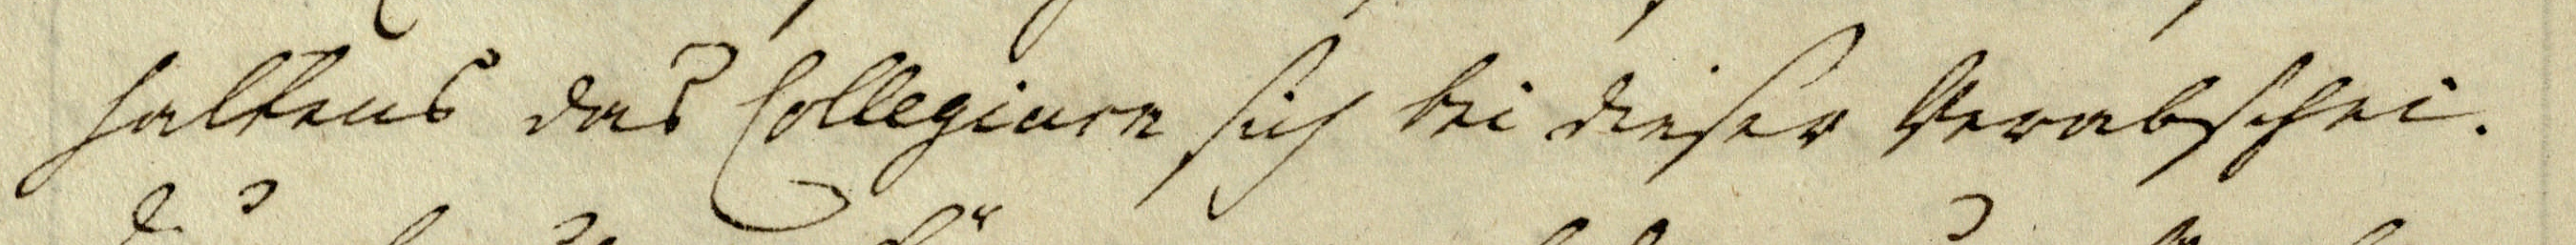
haltens das Collegium sich bei dieser Verabschei¬
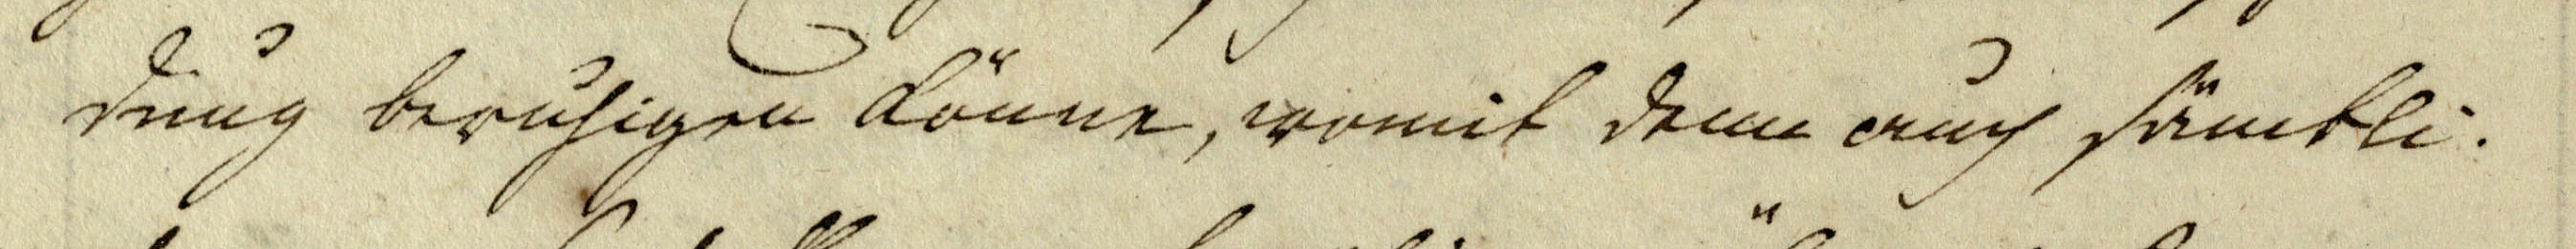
dung beruhigen könne, womit denn auch sämtli¬
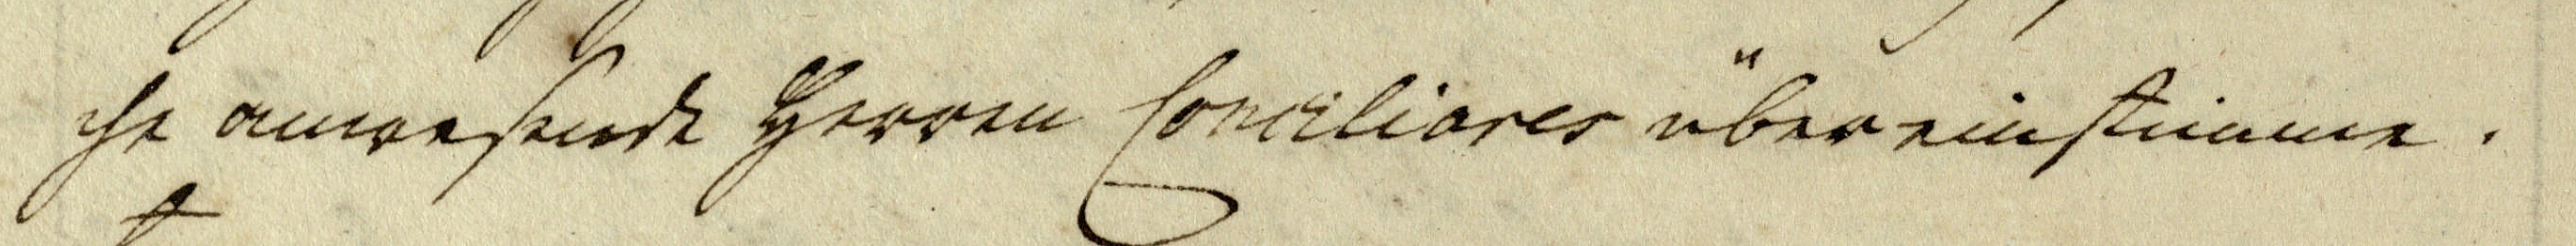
che anwesende Herren Conciliares übereinstimme¬
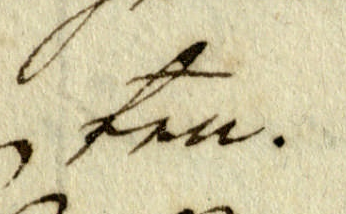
ten.
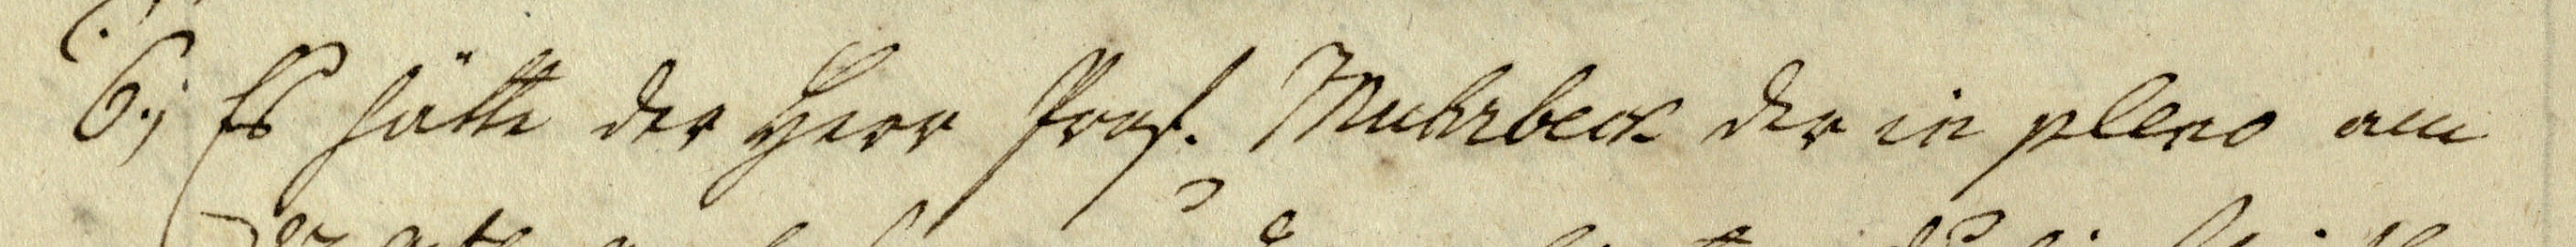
6., Es hätte der Herr Prof. Muhrbeck der in pleno am
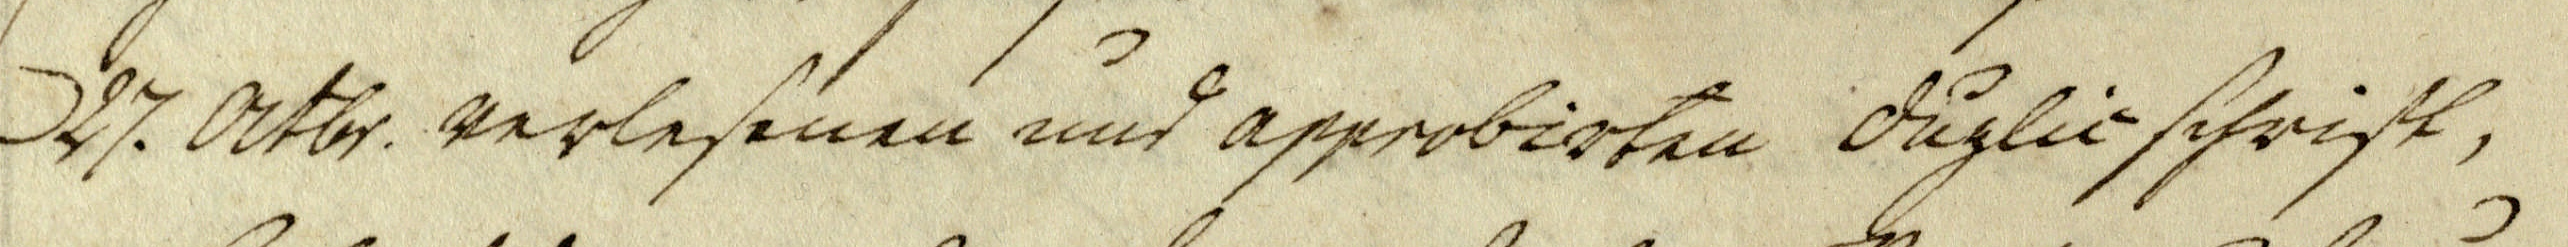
27. Octbr. verlesenen und approbirten Duplicschrift,
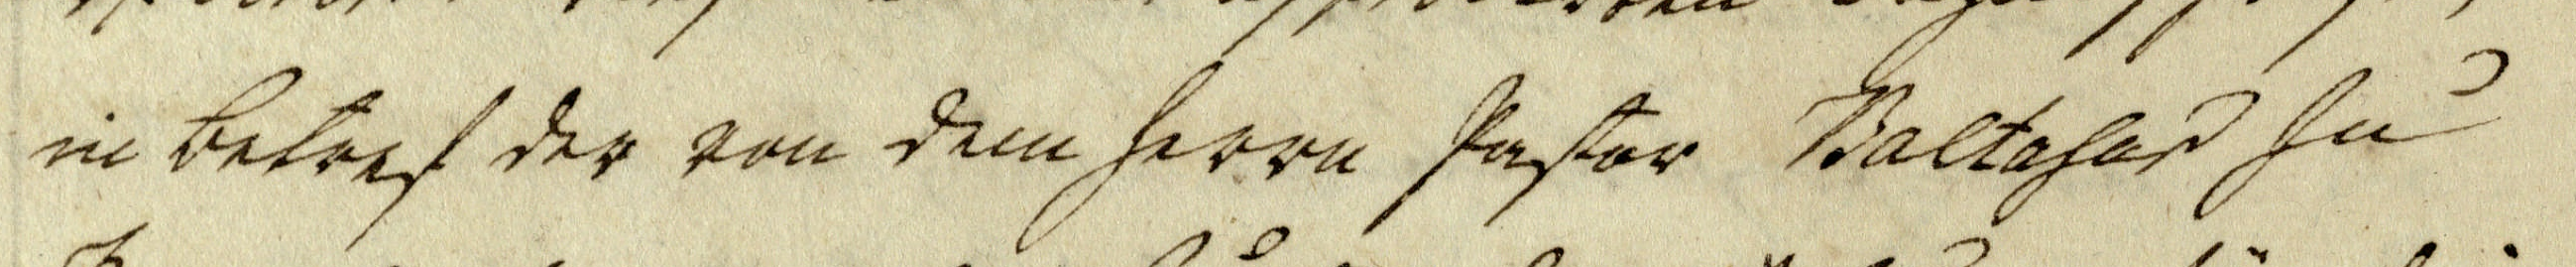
in Betref der von dem Herrn Pastor Baltasar zu
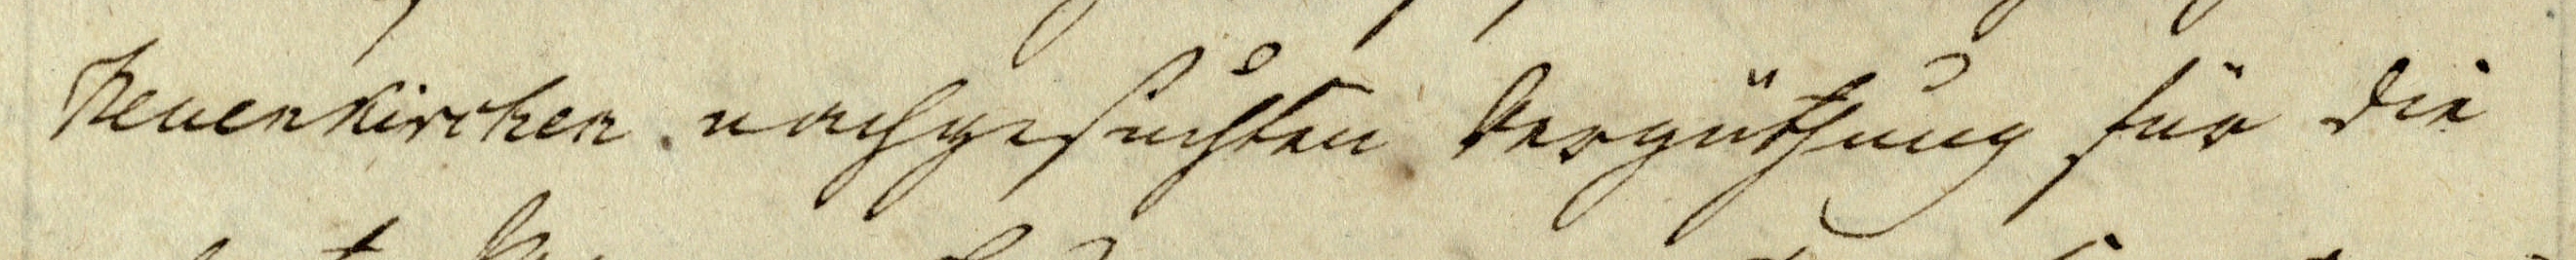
Neuenkirchen nachgesuchten Vergüthung für die
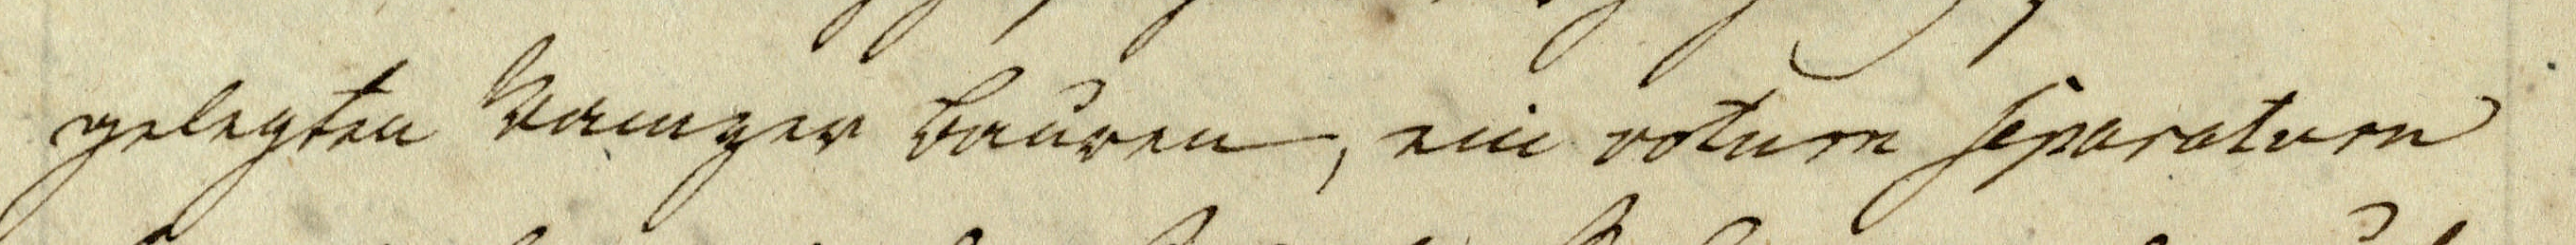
gelegten Wamper Bauren, ein votum separatum
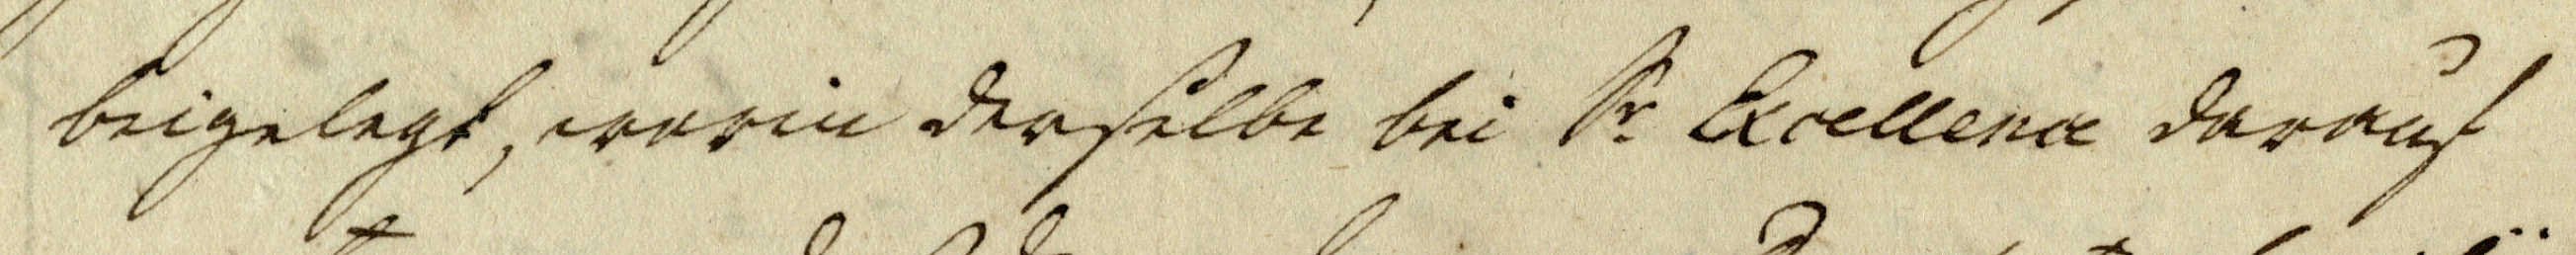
beigelegt, worin derselbe bei Sr Excellence darauf
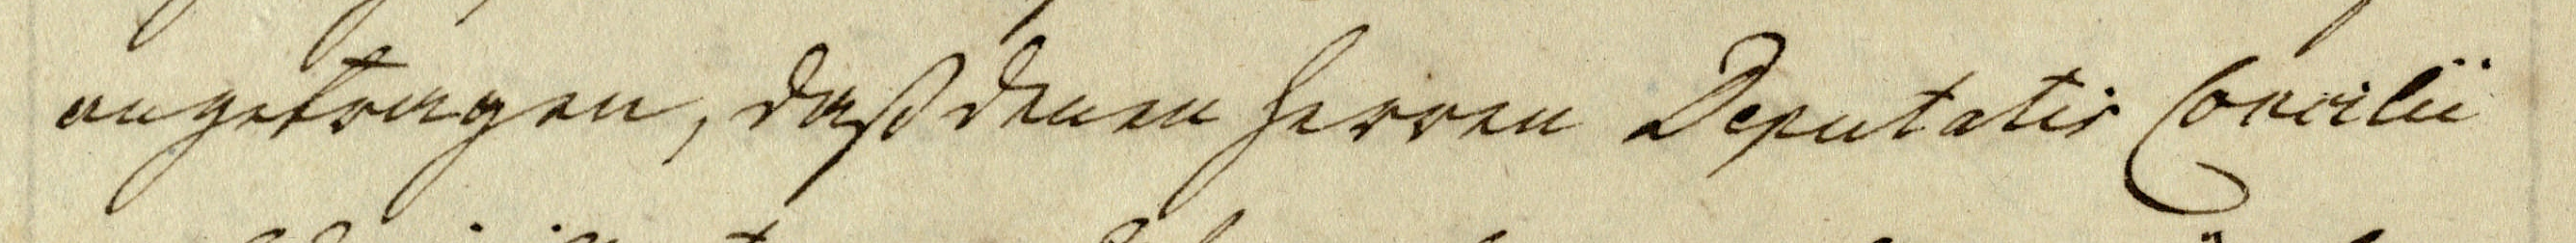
angetragen, daß denen Herren Deputatis Concilii
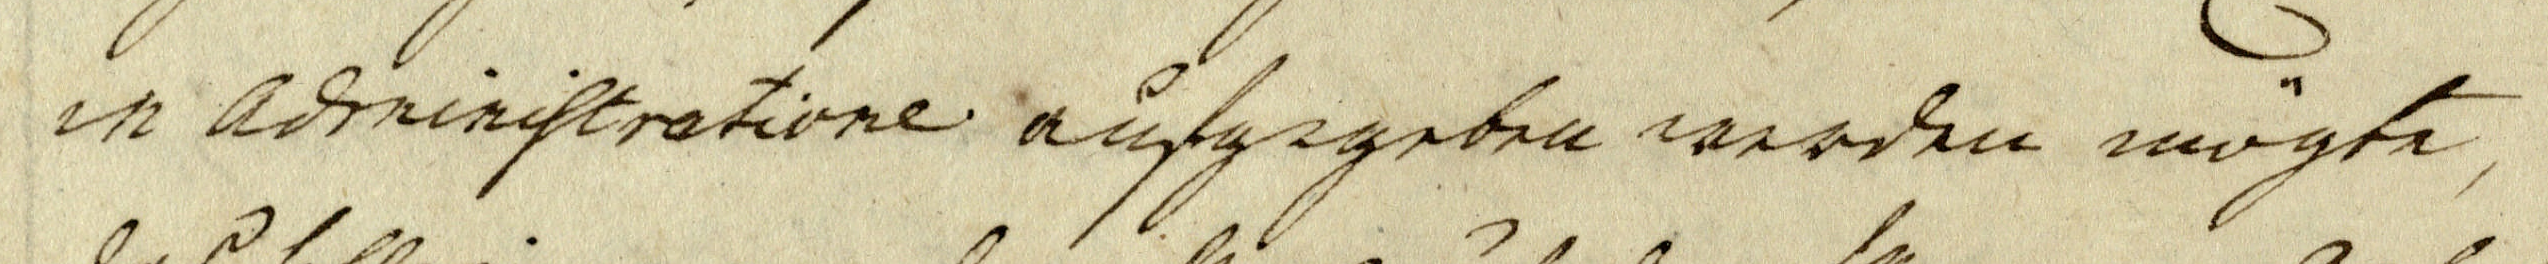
in Administratione aufgegeben werden mögte,
